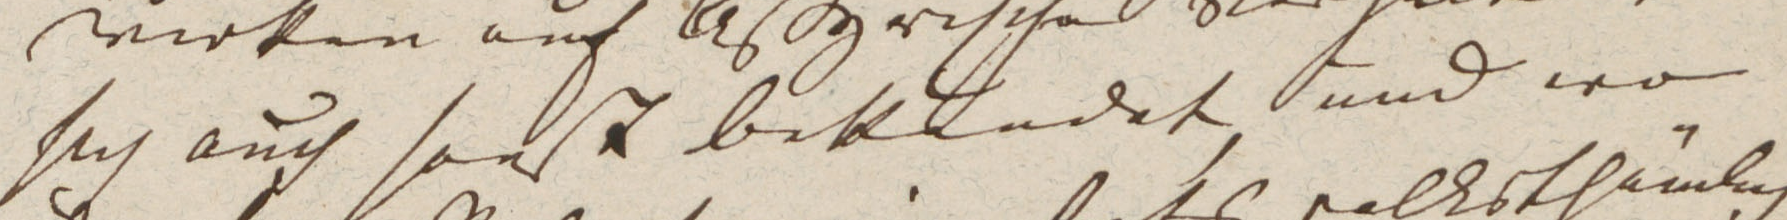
sich auch sonst bekundet, und wo
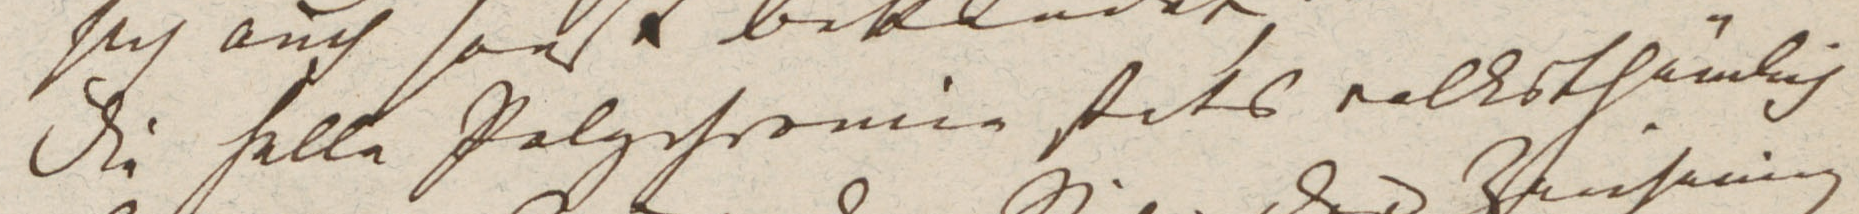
die helle Polychromie stets volksthümlich
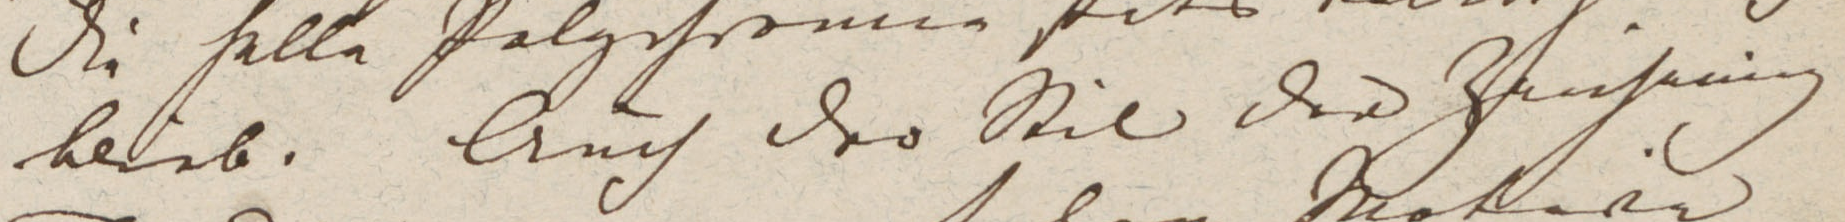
blieb. Auch der Stil der Zeichnung
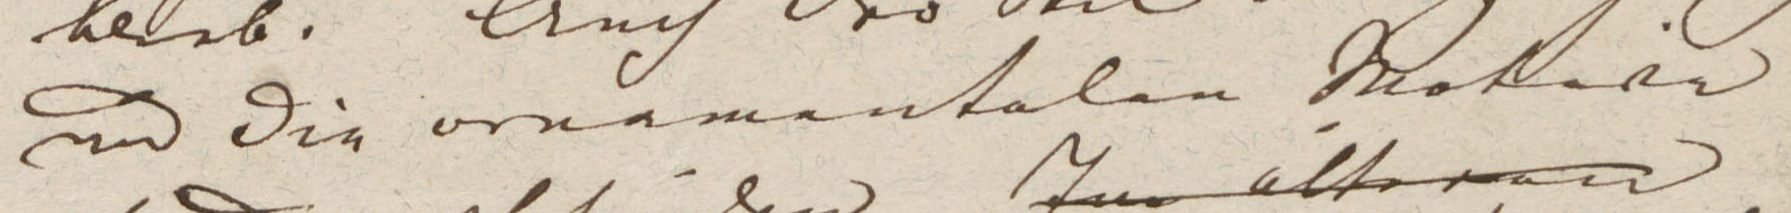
und die ornamentalen Motive
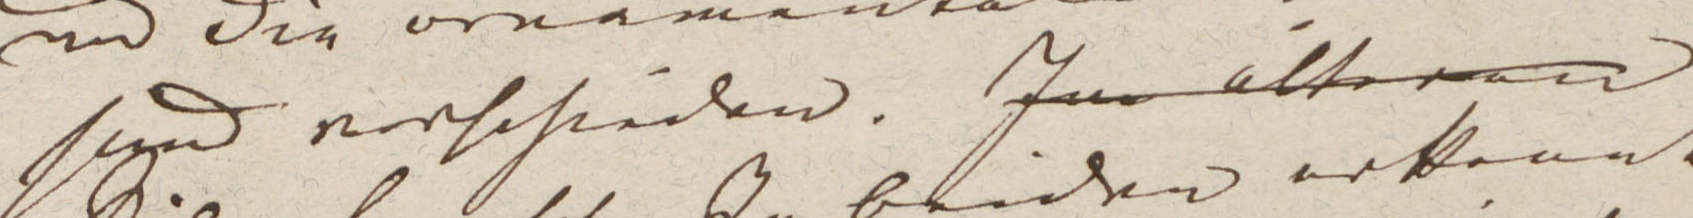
sind verschieden. Im älteren
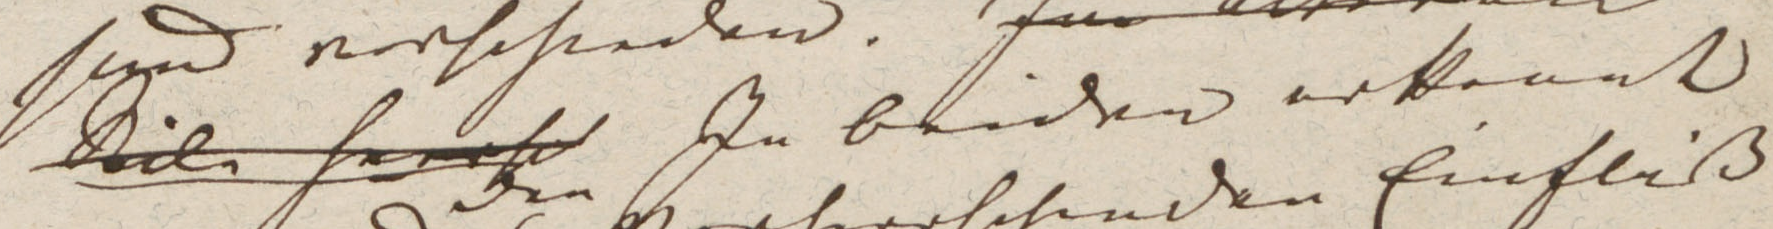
Stile herrsc In beiden erkennt
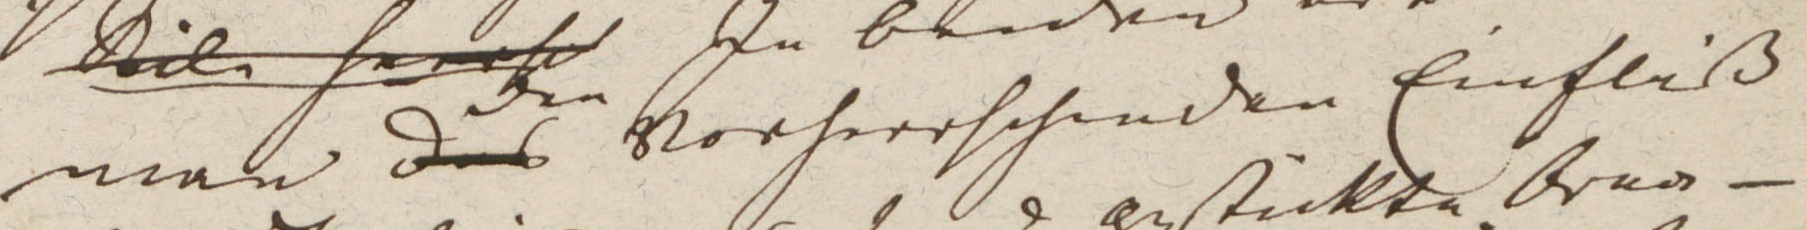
man das den vorherrschenden Einfluss
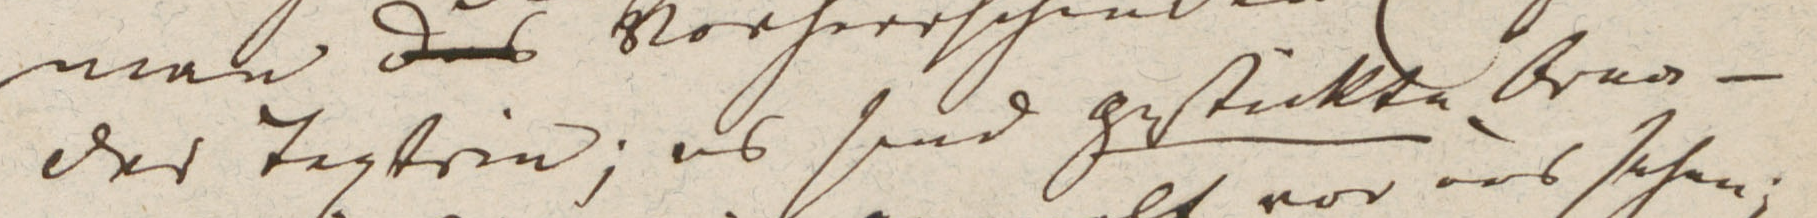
der Textrin; es sind gestickte Orna-
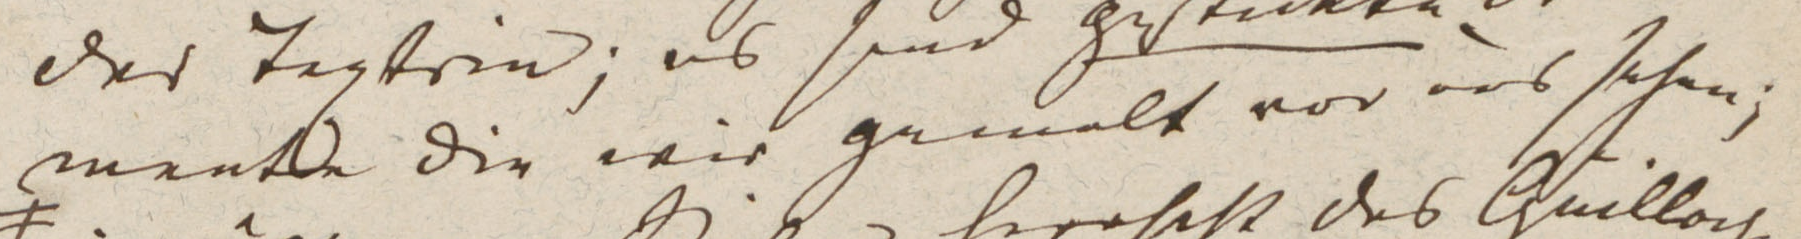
mente die wir gemalt vor uns sehen;
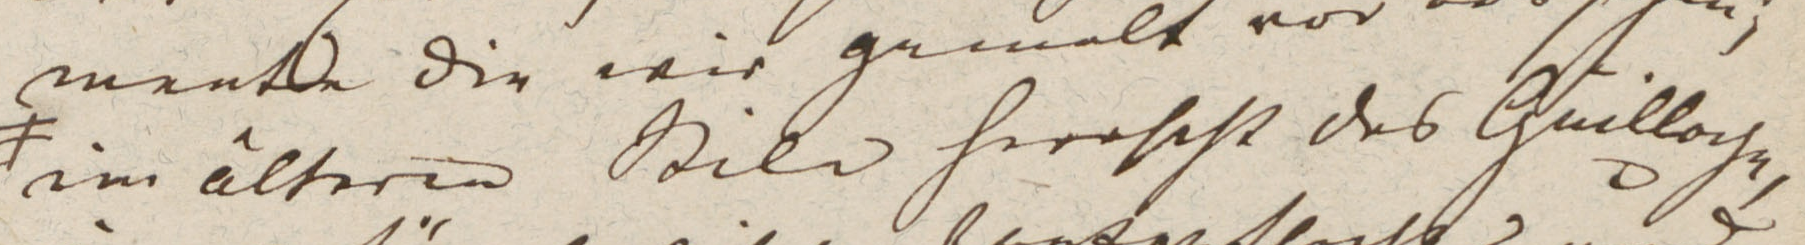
% im älteren Stile herrscht das Guilloche,
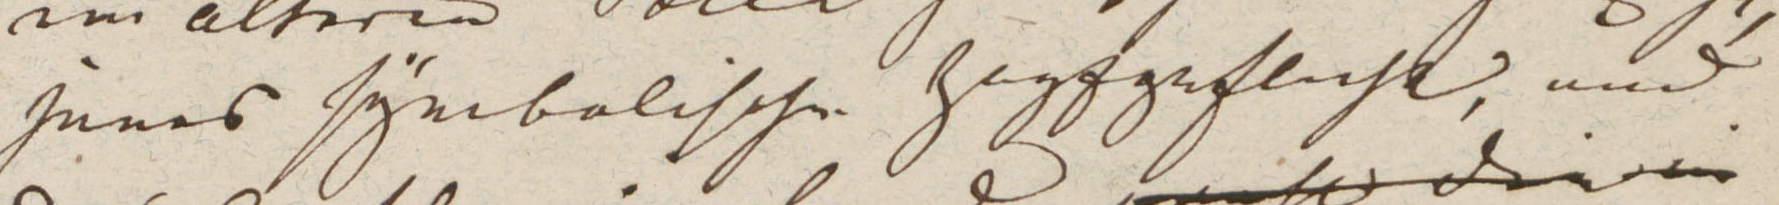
jenes symbolische Zopfgeflecht, und
